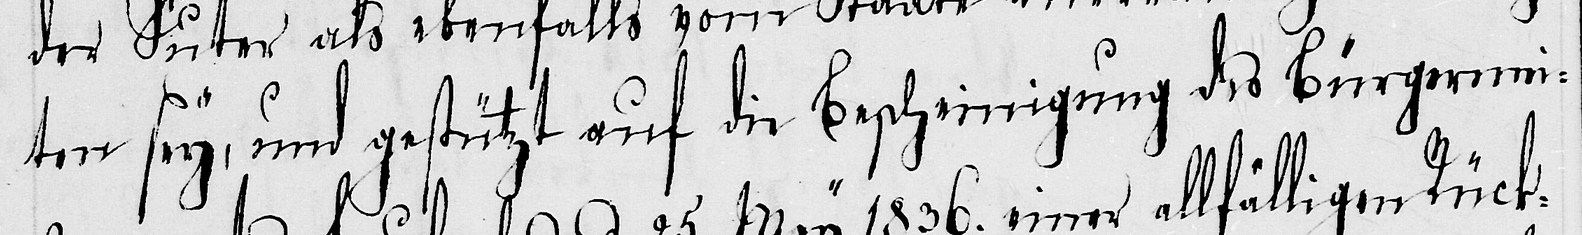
ten sey, und gestützt auf die Bescheinigung des Bürgermei¬
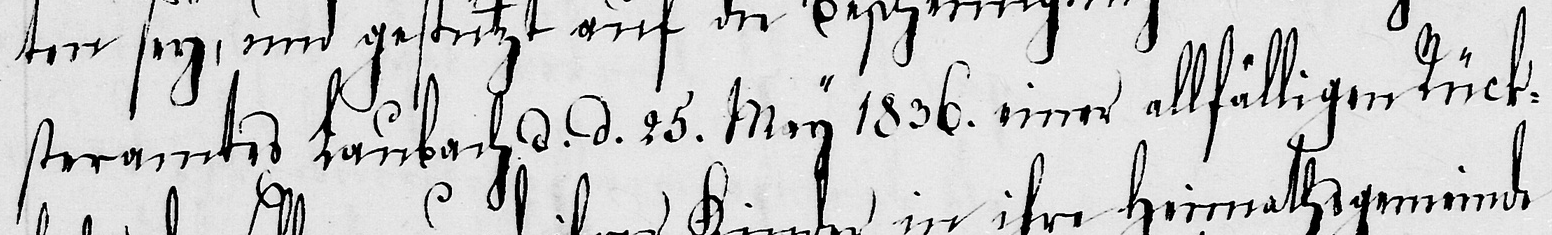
steramtes Laubach d. d. 25. May 1836. einer allfälligen Rück¬
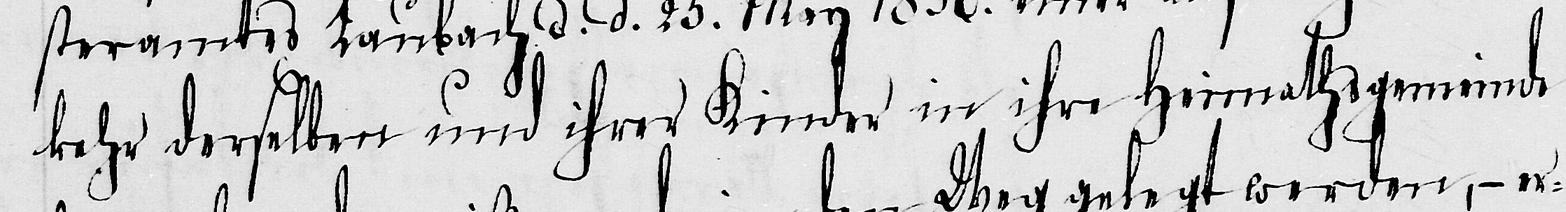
kehr derselben und ihrer Kinder in ihre Heimathsgemeinde
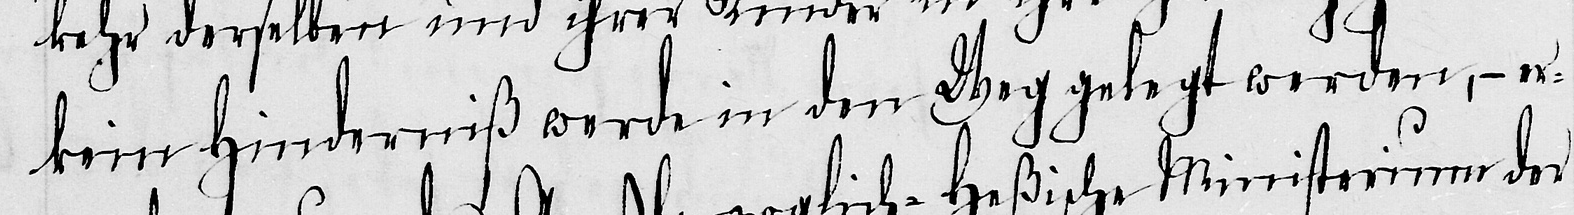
kein Hinderniß werde in den Weg gelegt werden, – er¬
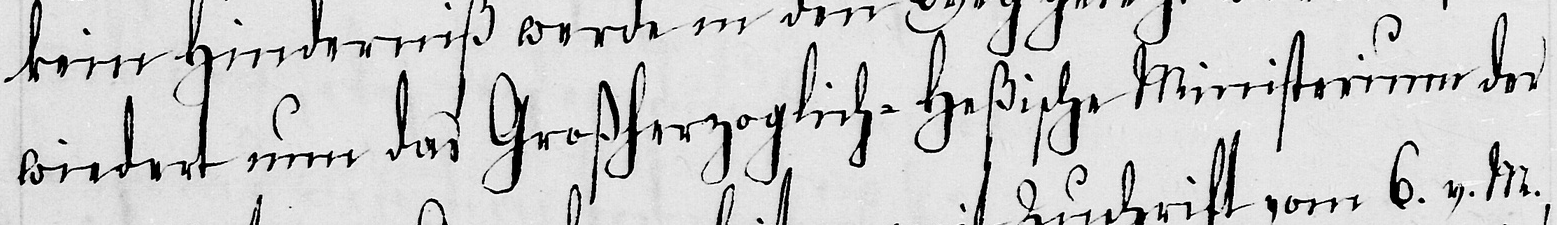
wiedert nun das Großherzoglich-Heßische Ministerium der
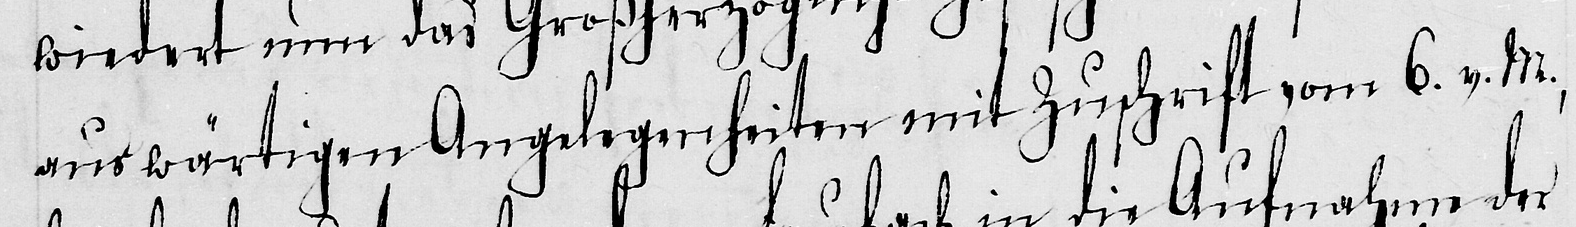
auswärtigen Angelegenheiten mit Zuschrift vom 6. v. M.,
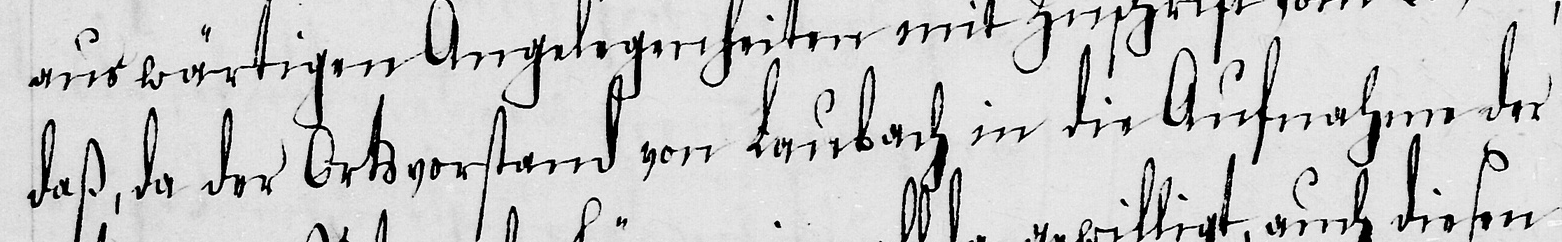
daß, da der Ortsvorstand von Laubach in die Aufnahme der
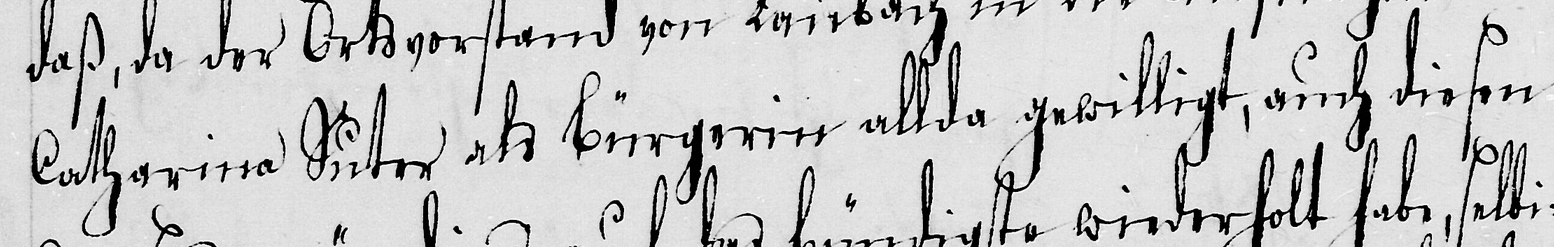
Catharina Suter als Bürgerin allda gewilligt, auch diesen
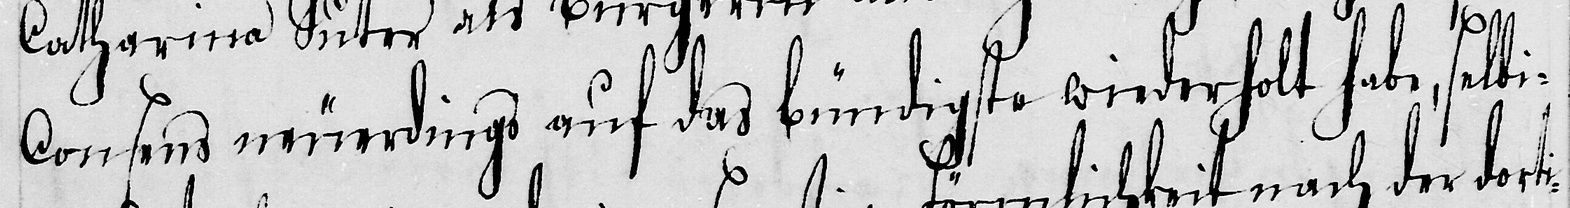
Consens neuerdings auf das bündigste wiederholt habe, selbi¬
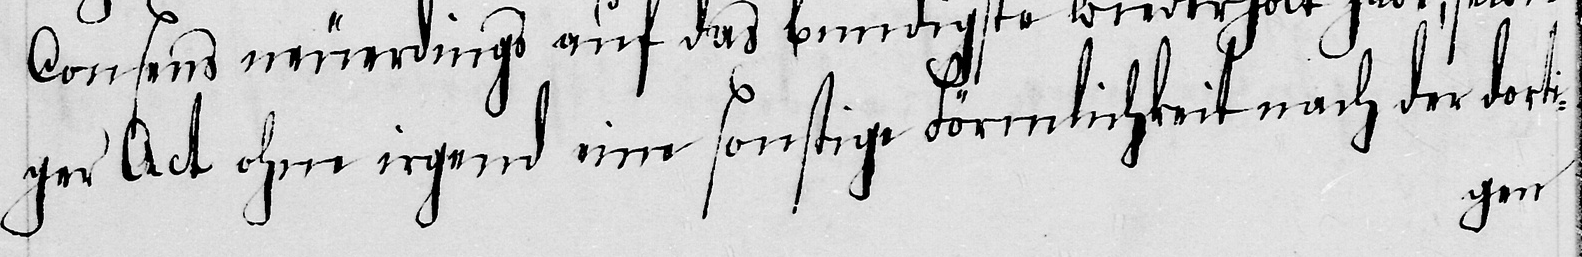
ger Ort ohne irgend eine sonstige Förmlichkeit nach der dor¬
